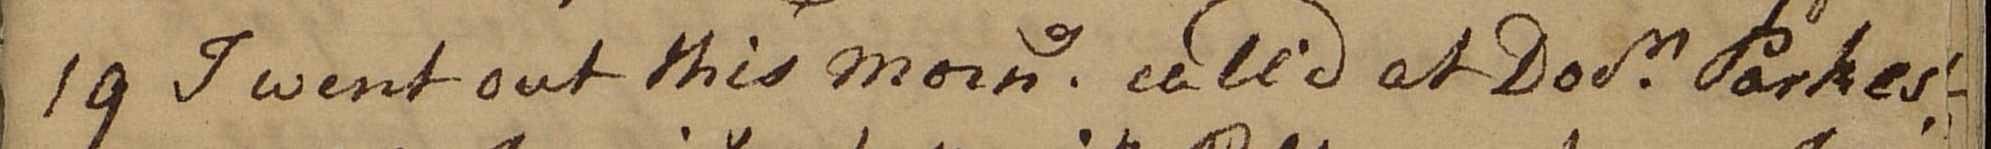19 I went out this morn^g. call'd at Doc^r. Parkes
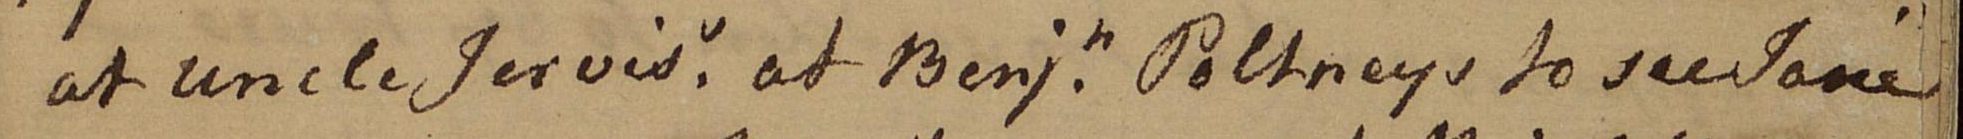at Uncle Jervis^s. at Benj^n. Poltneys to see Jane
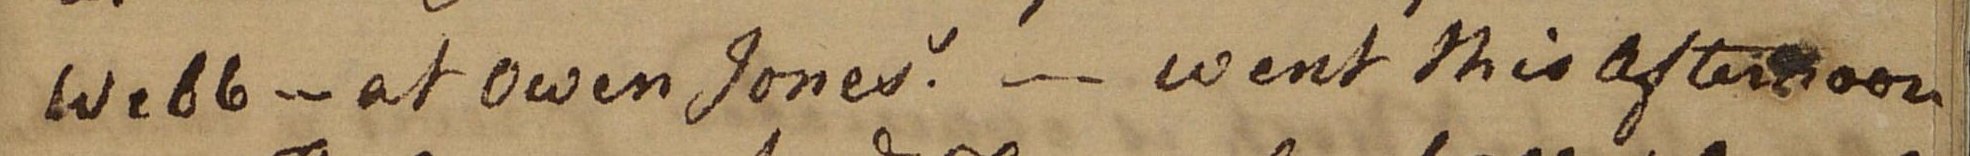Webb- at Owen Jones^s. - went this Afternoon
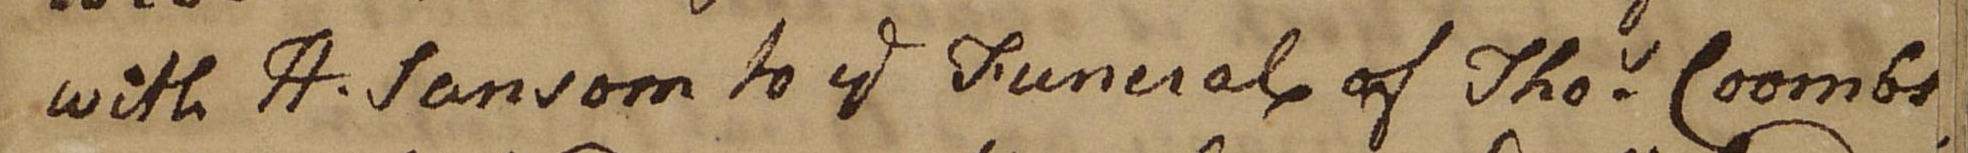with H. Sansom to y^e Funeral of Tho^s. Coombs
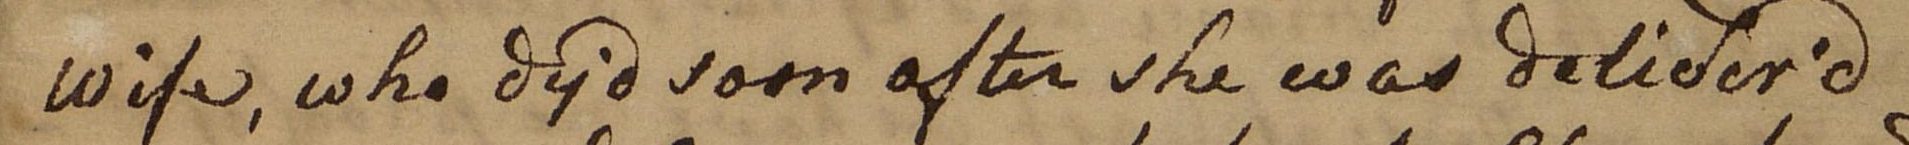Wife, who dy'd soon after she was deliver'd
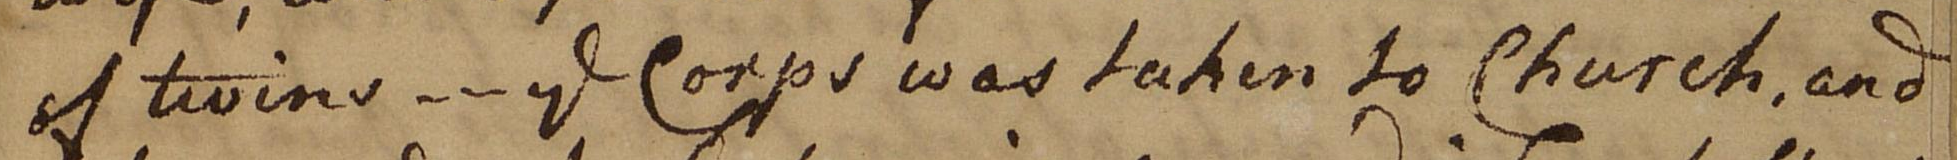of twins-- y^e Corps was taken to Church, and
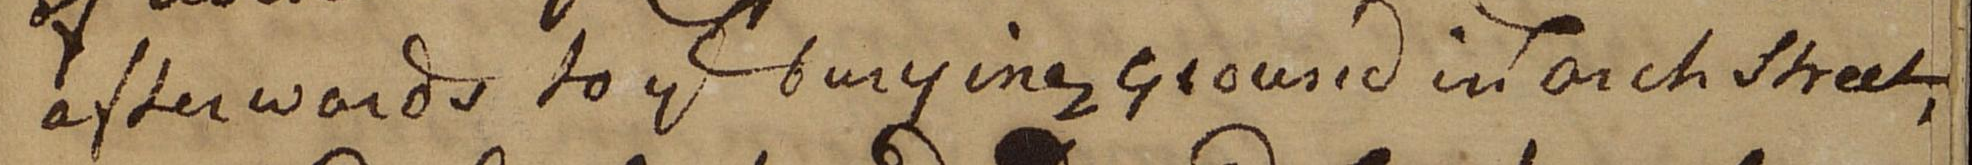afterwards to y^e burying Ground in Arch Street,
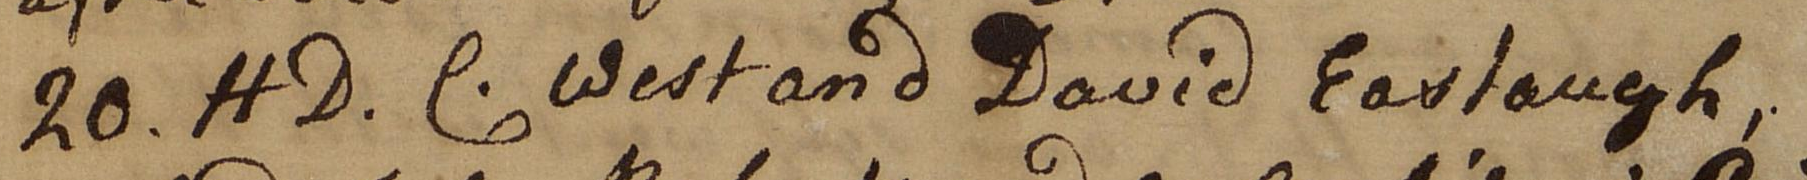20. H D. C. West and David Eastaugh,
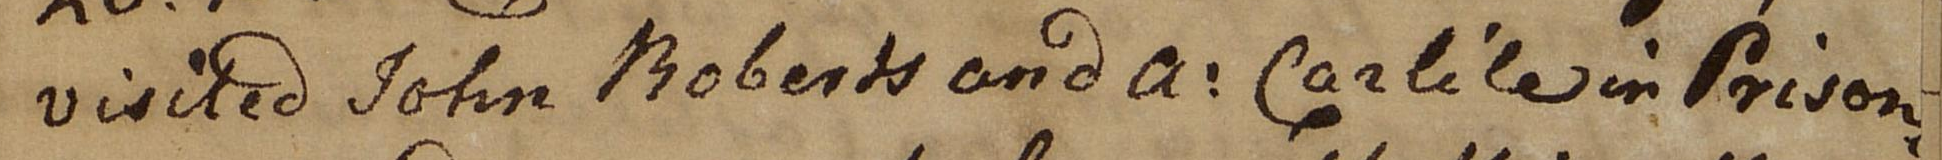visited John Roberts and A: Carlile in Prison
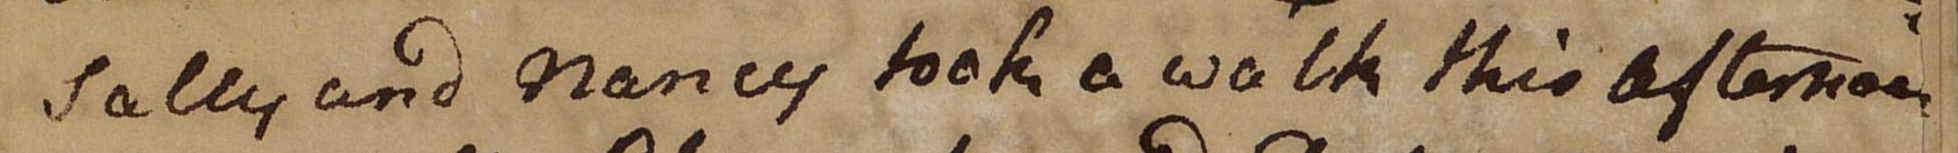Sally and Nancy took a walk this afternoon
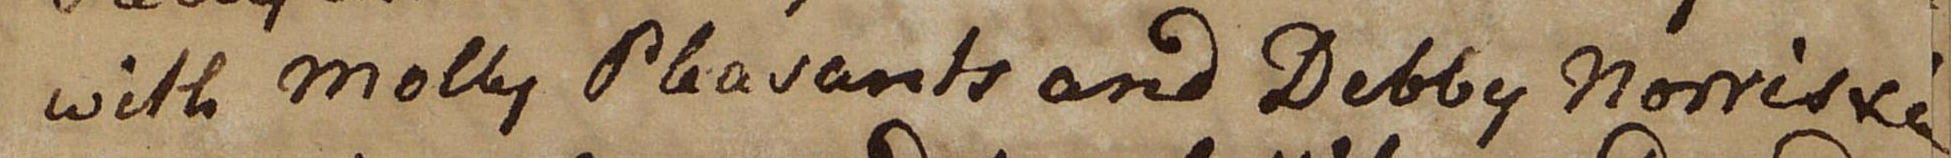with Molly Pleasants and Debby Norris &c
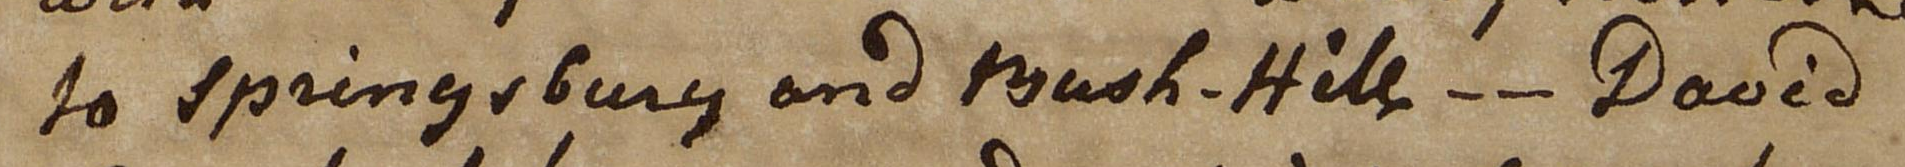to Springsbury and Bush-Hill-- David
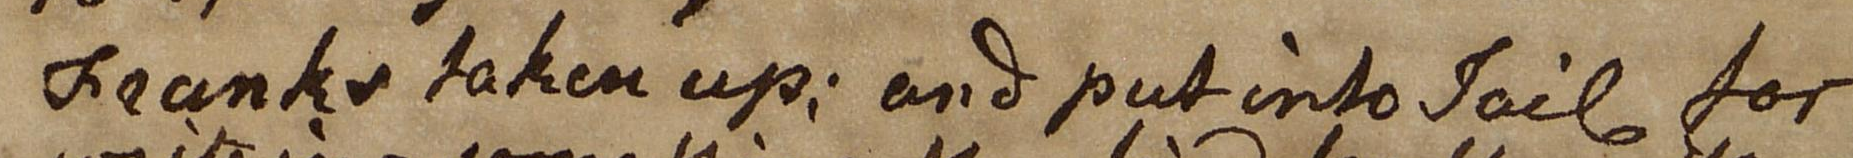Franks taken up; and put into Jail, for
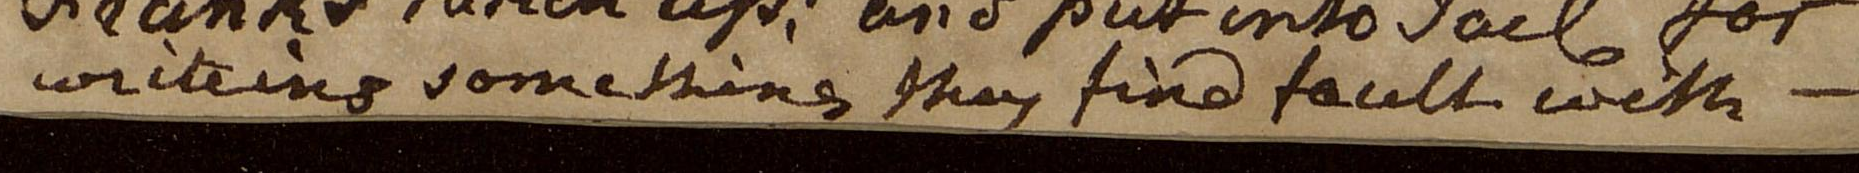writeing something they find fault with-
